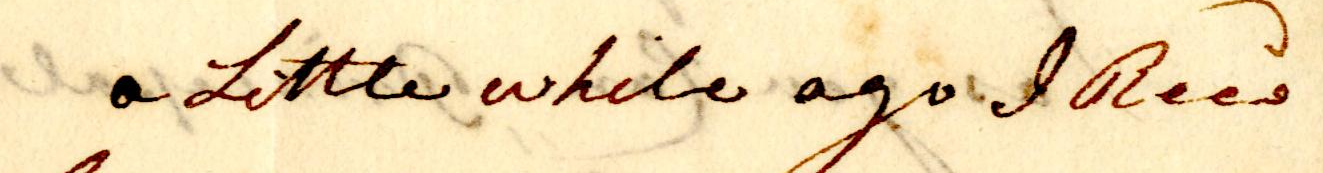a Little while ago I Rece^d
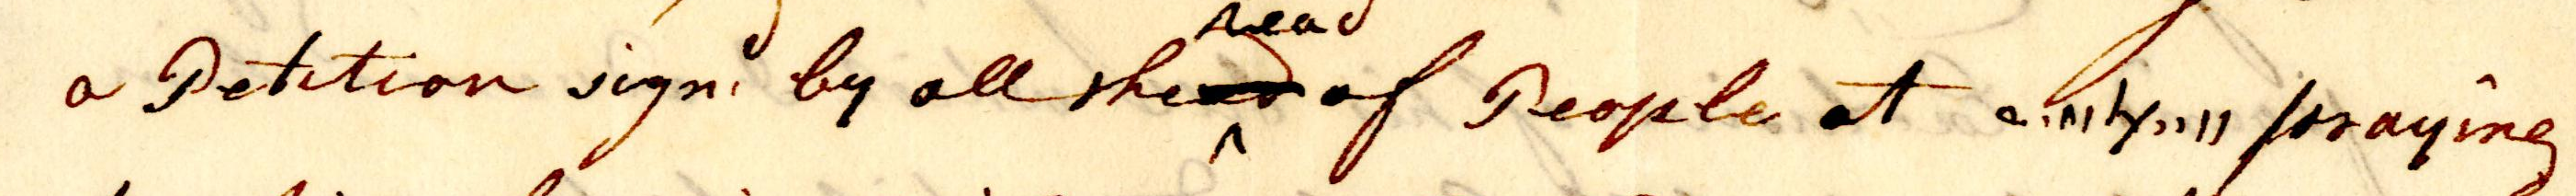a Petition sign^d by all the [__] ^ of People at [_____] praying
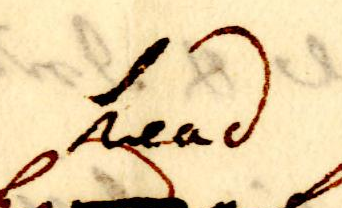head
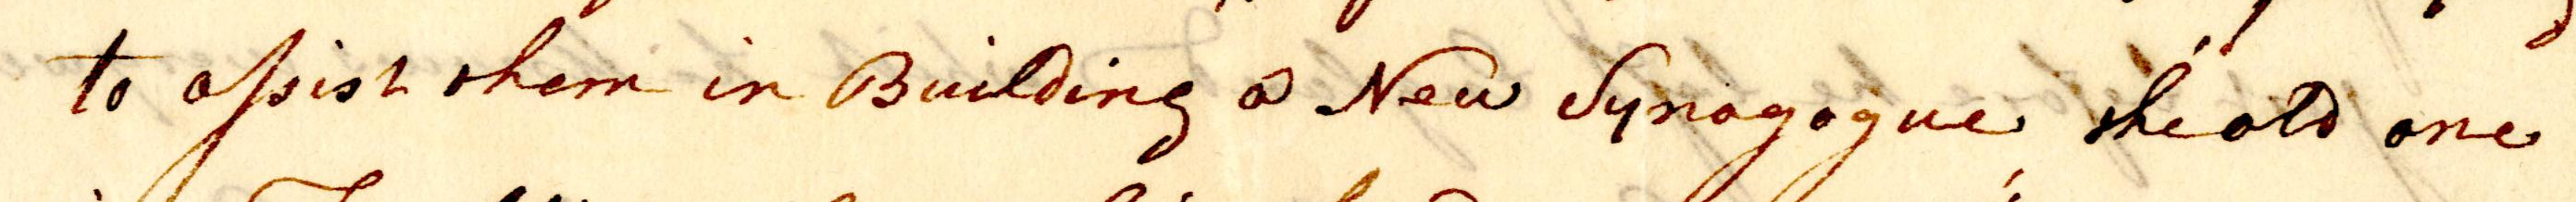to assist them in Building a New Synogogue the old one
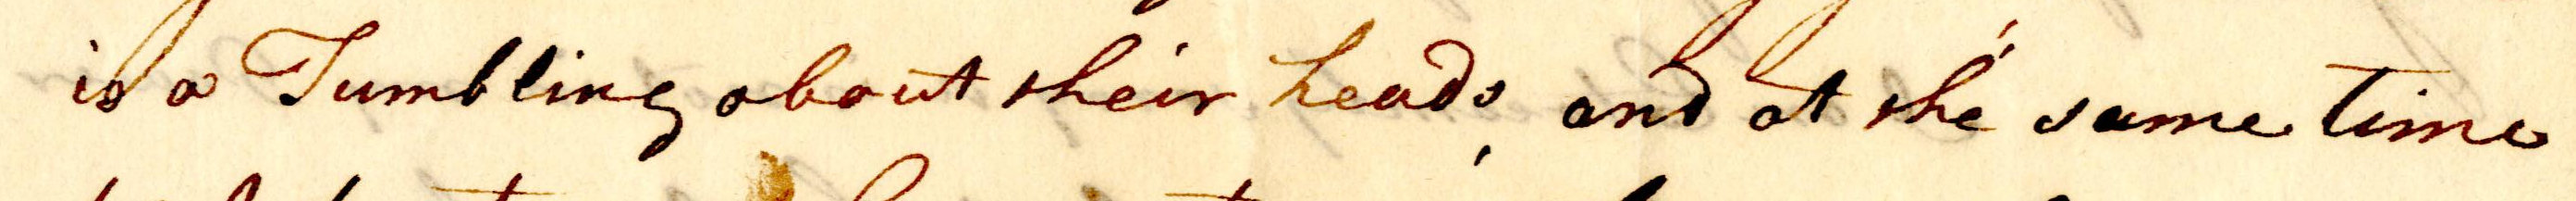is a Tumbling about their heads and at the same time
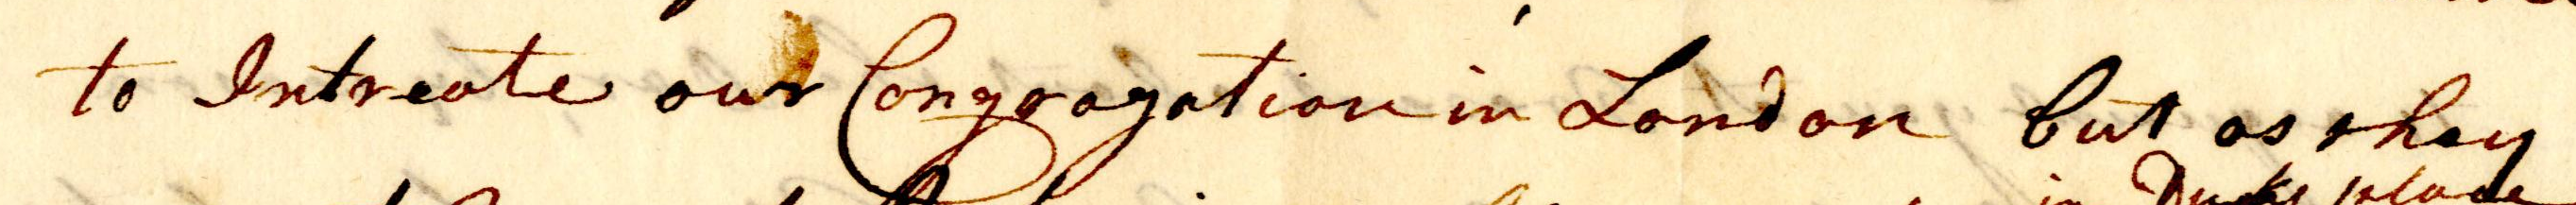to Intreate our Congregation in London but as they
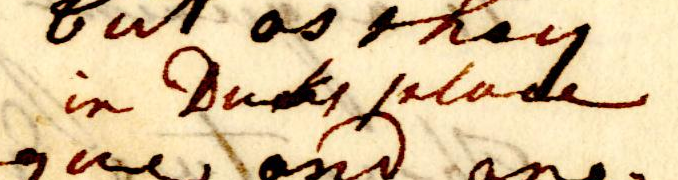in Dusks place
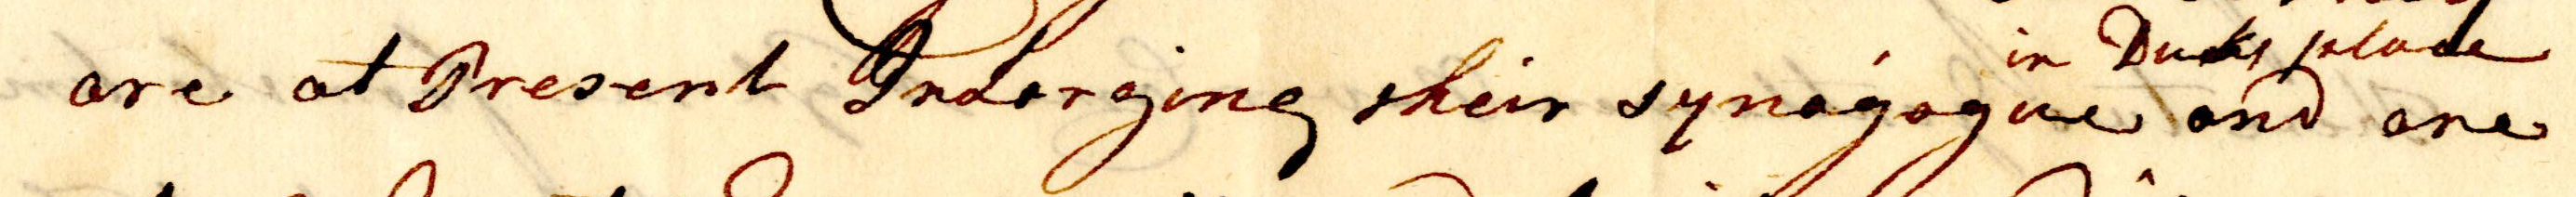are at Present Inlarging their synagogue and one
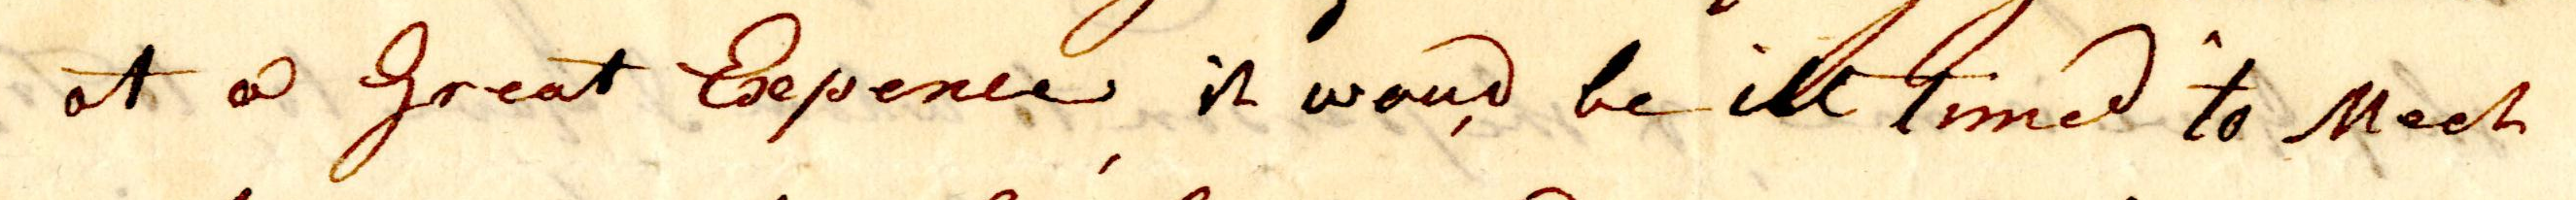at a Great Expence it woud be ill timed to Meet
